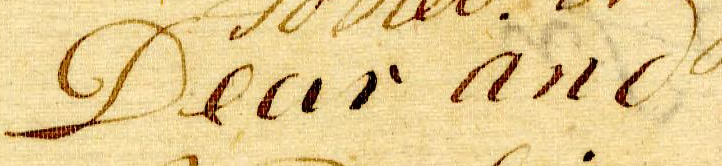Dear and
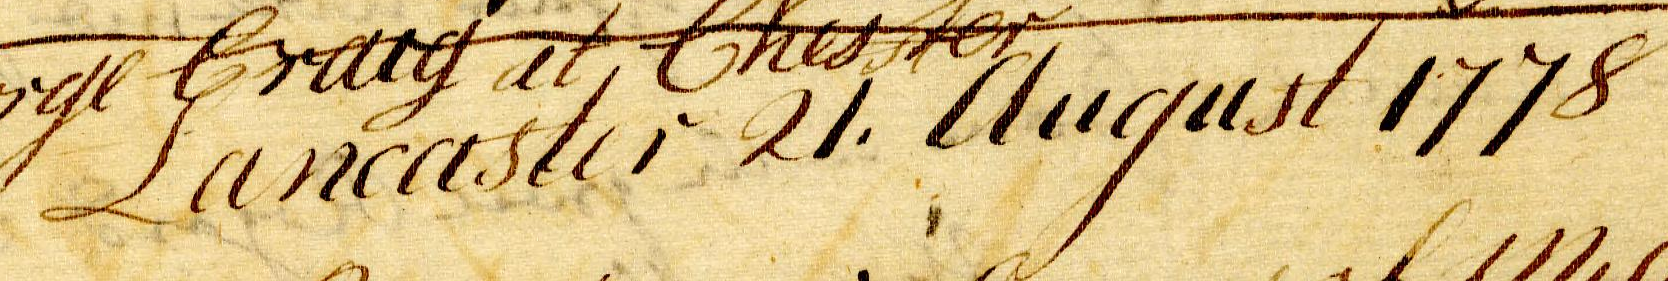Lancaster 21. August 1778
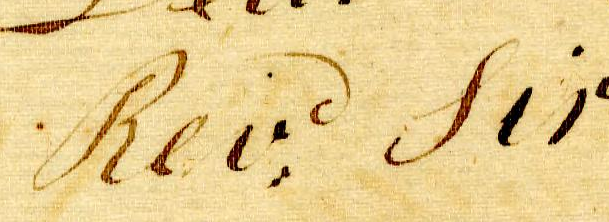Rev^d. Sir
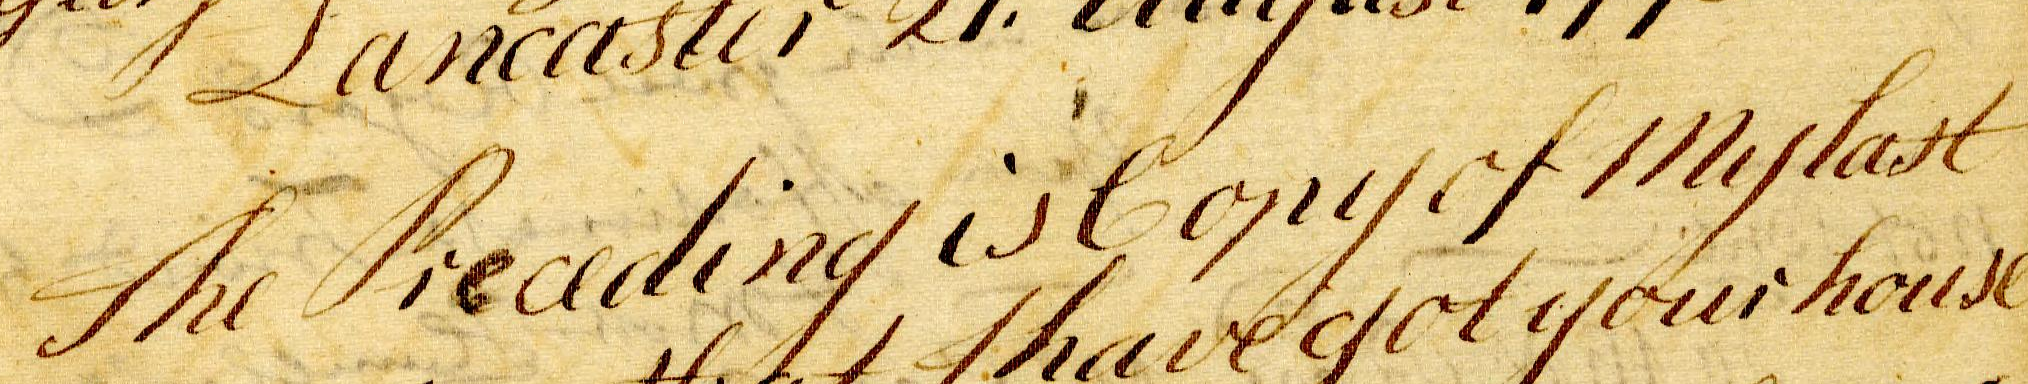The Preceding is Copy of My last
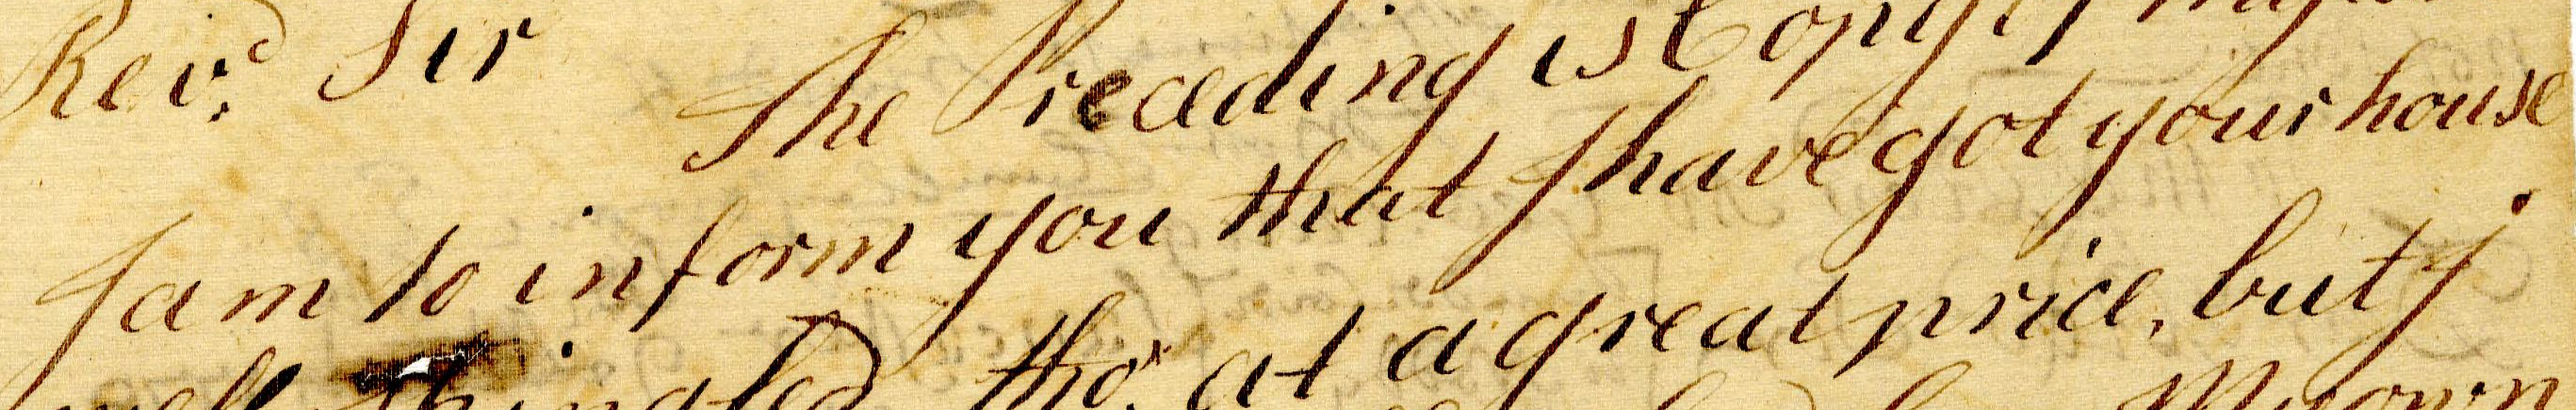I am to inform you that I have got your house
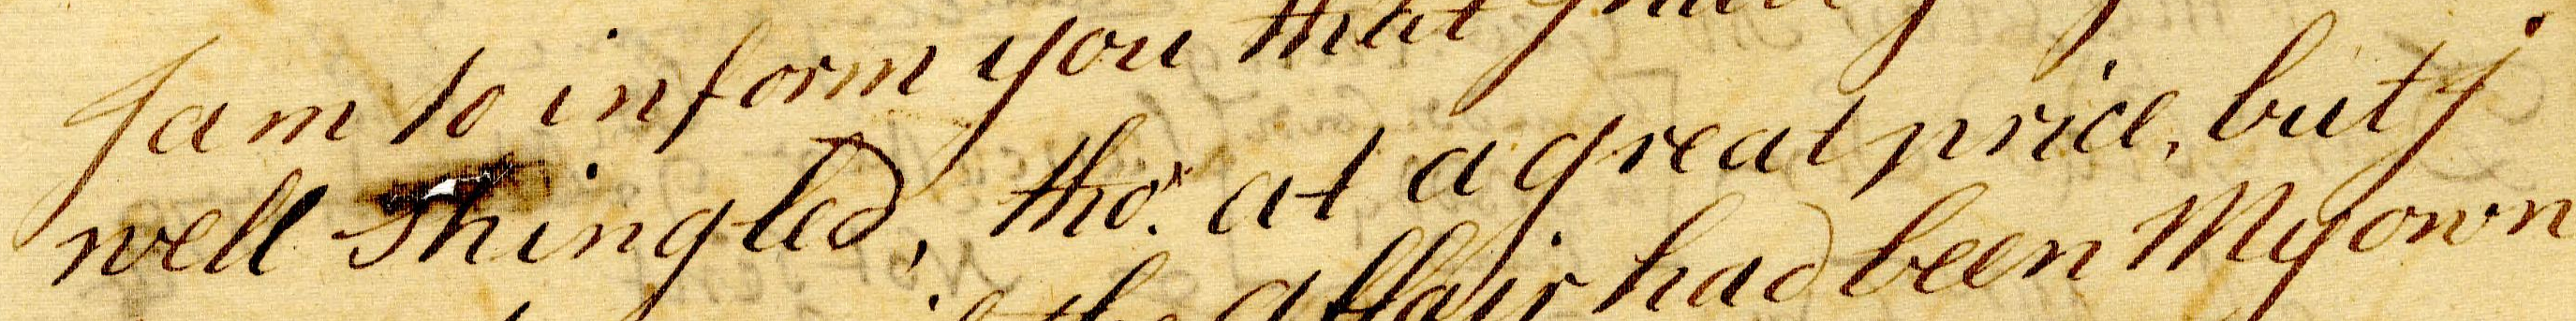well shingled, tho'. at a great price, but I
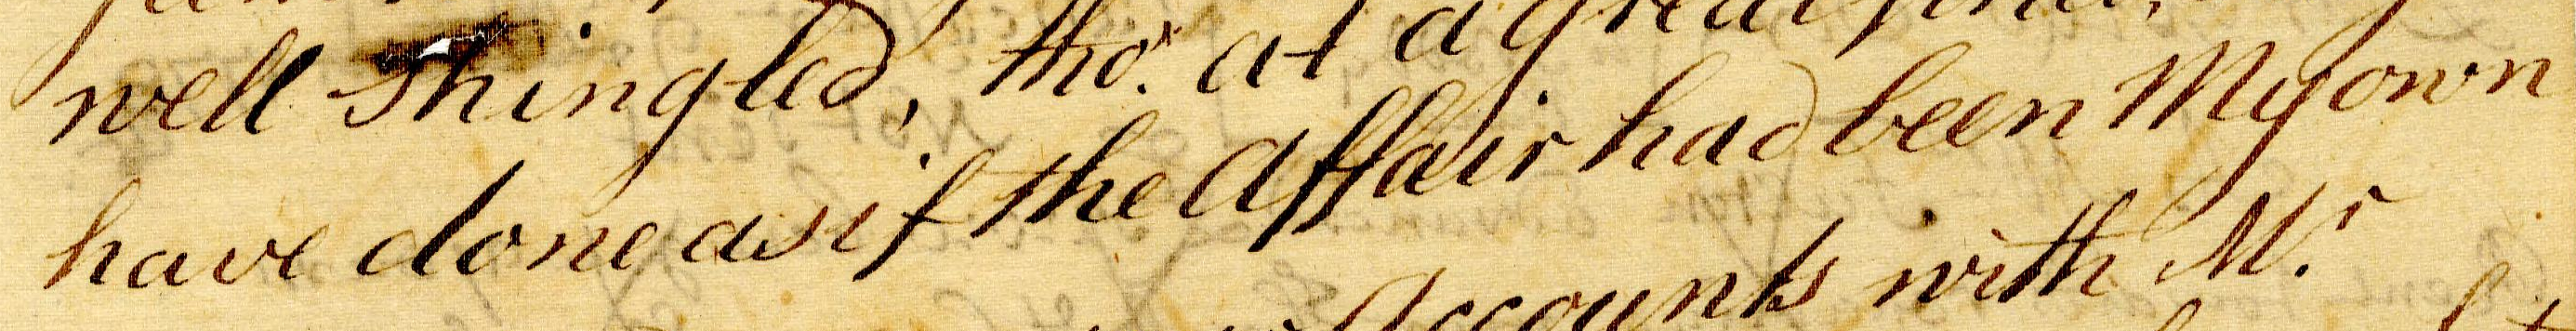have done as if the Affair had been My own
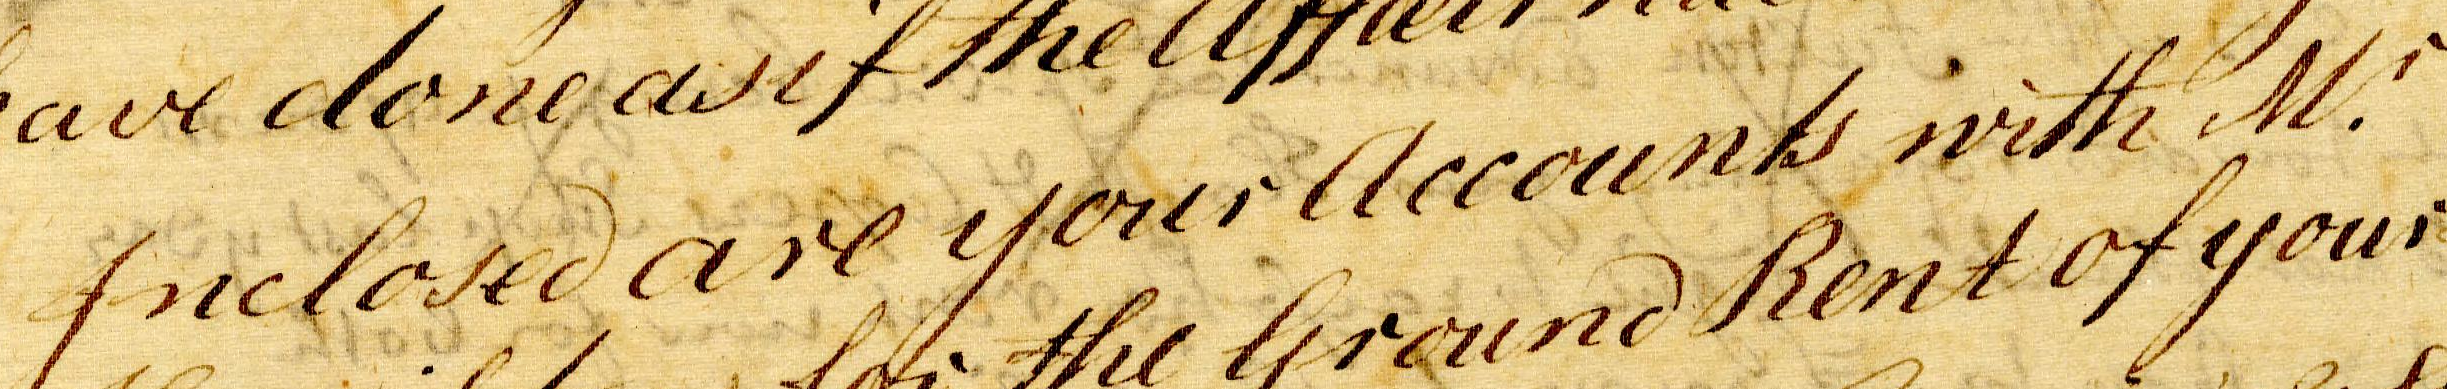Inclosed are your Accounts with M^r.
